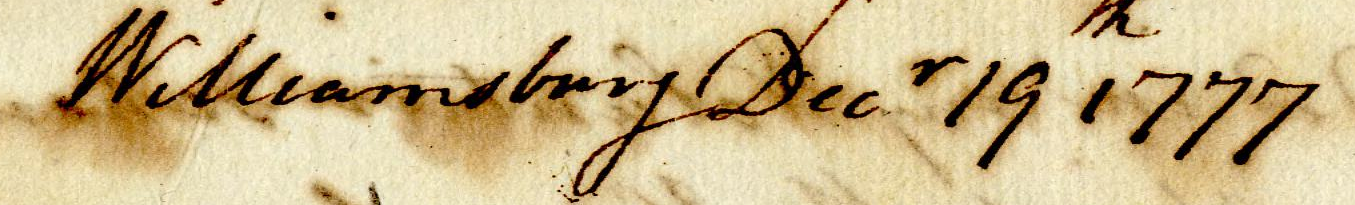Williamsburg Dec^r 19^th 1777
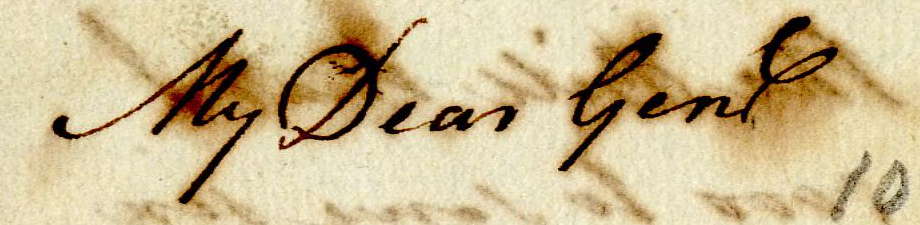My Der Gen^l
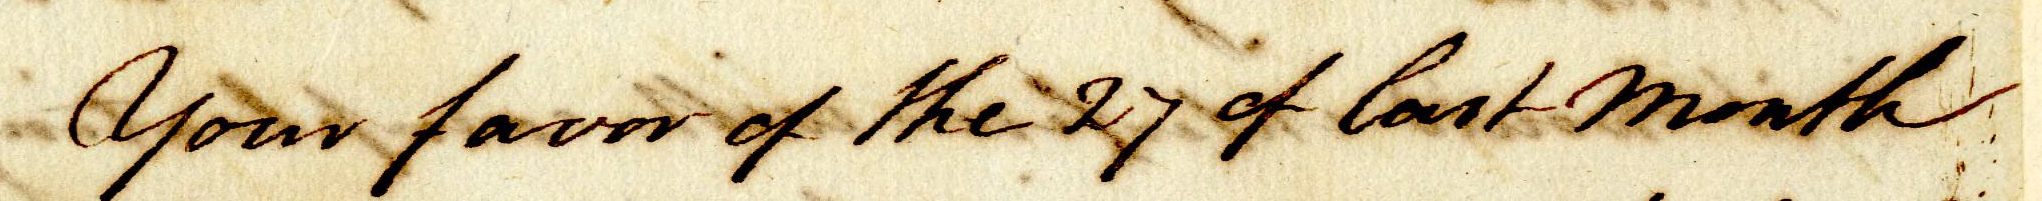Your favor of the 27 of last month
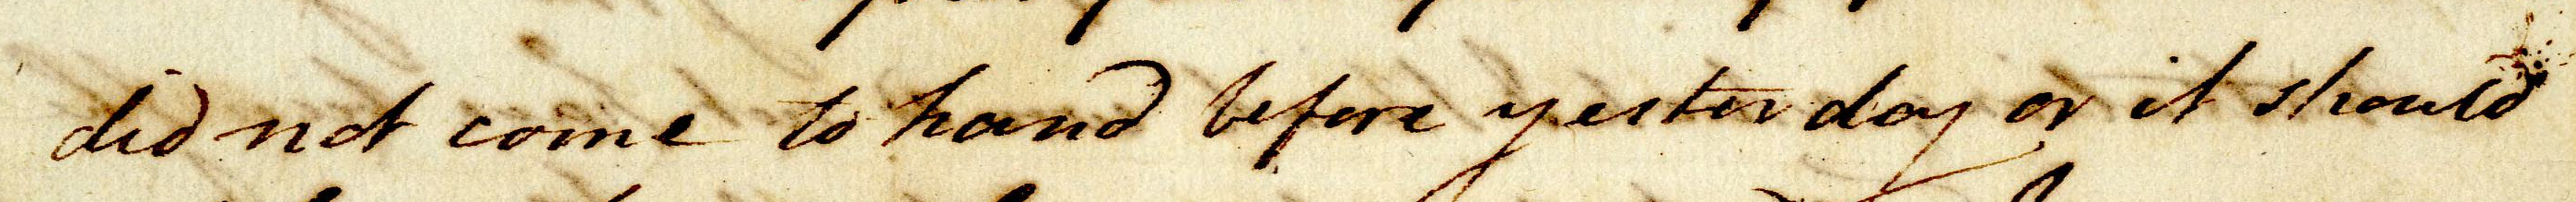did not come to hand before yesterday or it should
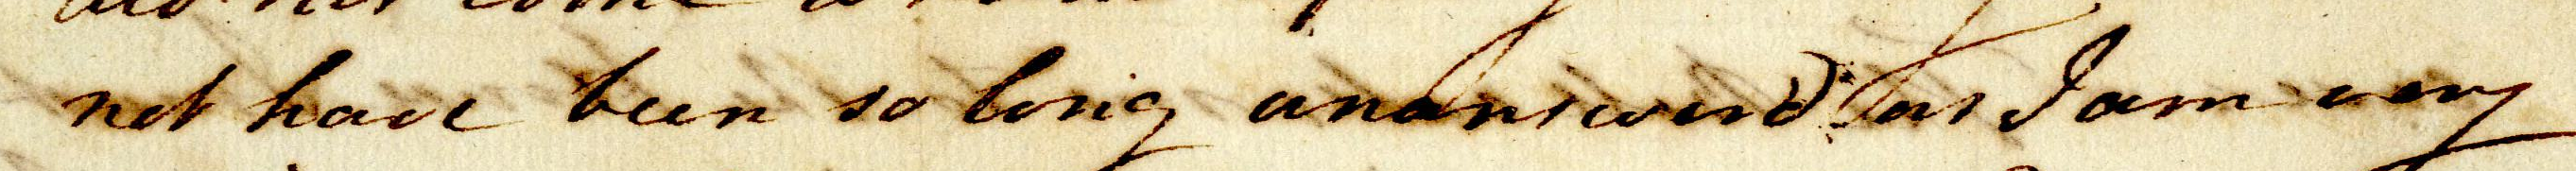not have been so long unanswered as I am very
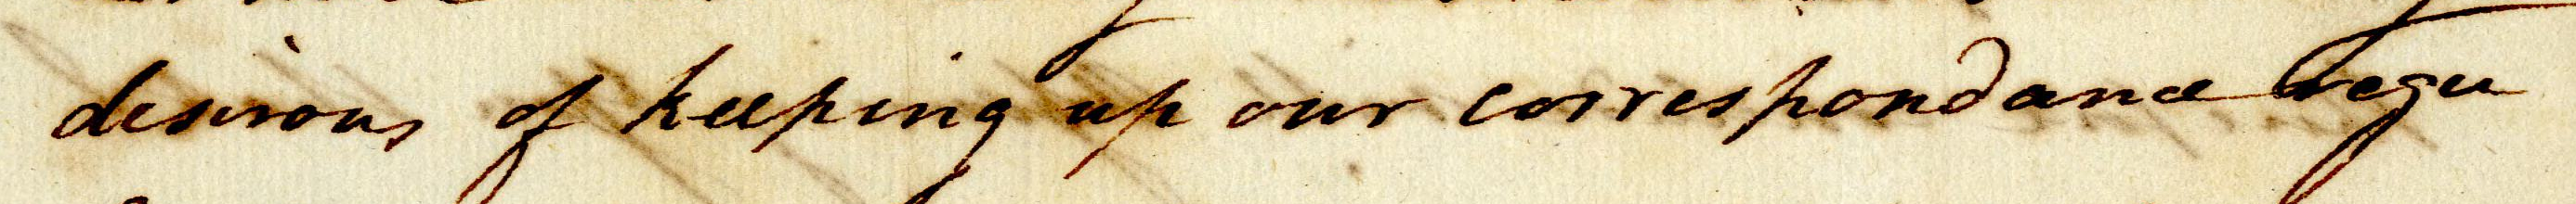desirous of keeping up our correspondance regu
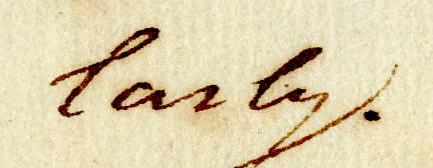larly.
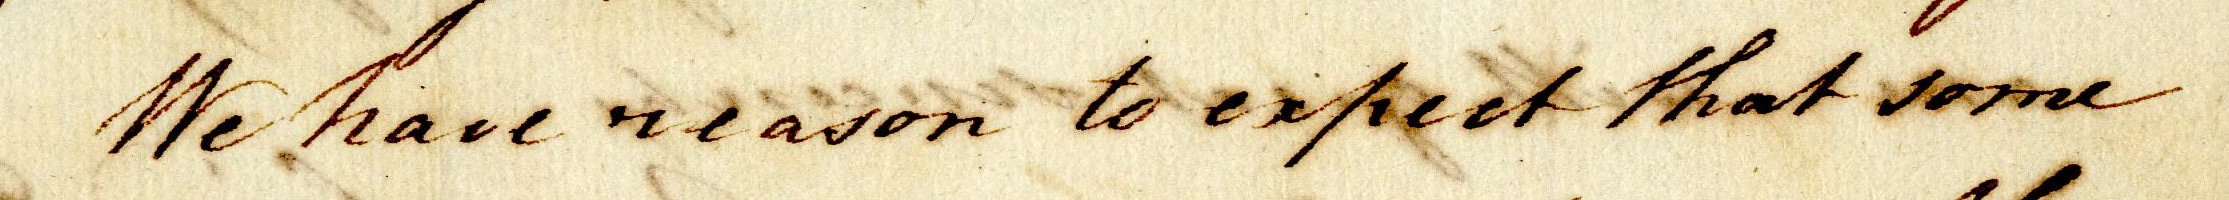We have reason to expect that some
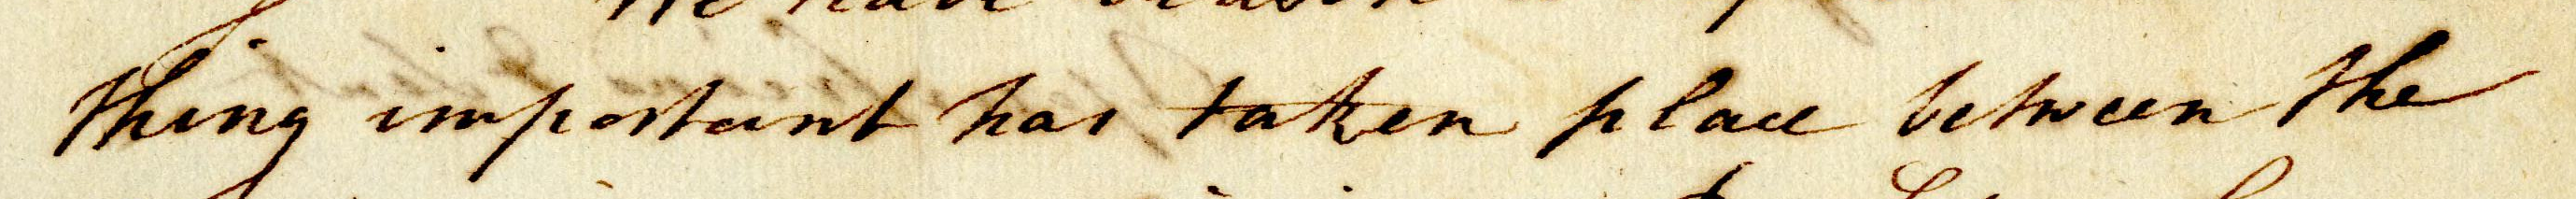thing important has taken place between the
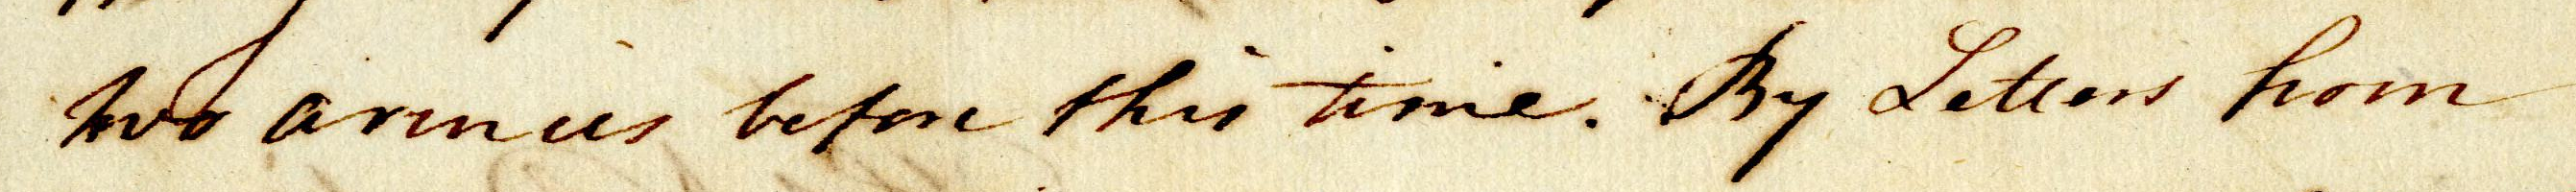two armies before this time. By Letters from
